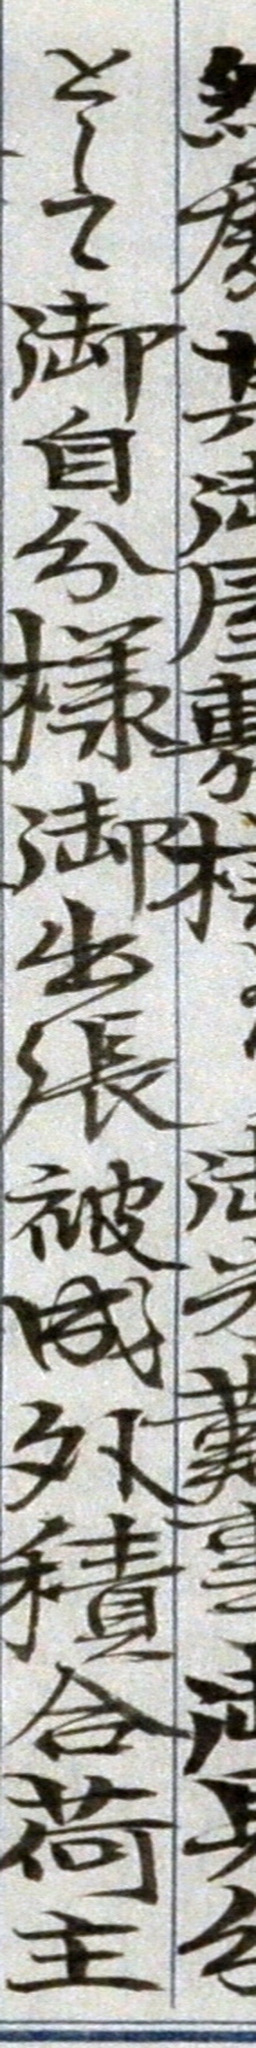として御自分様御出張被成外積合荷主
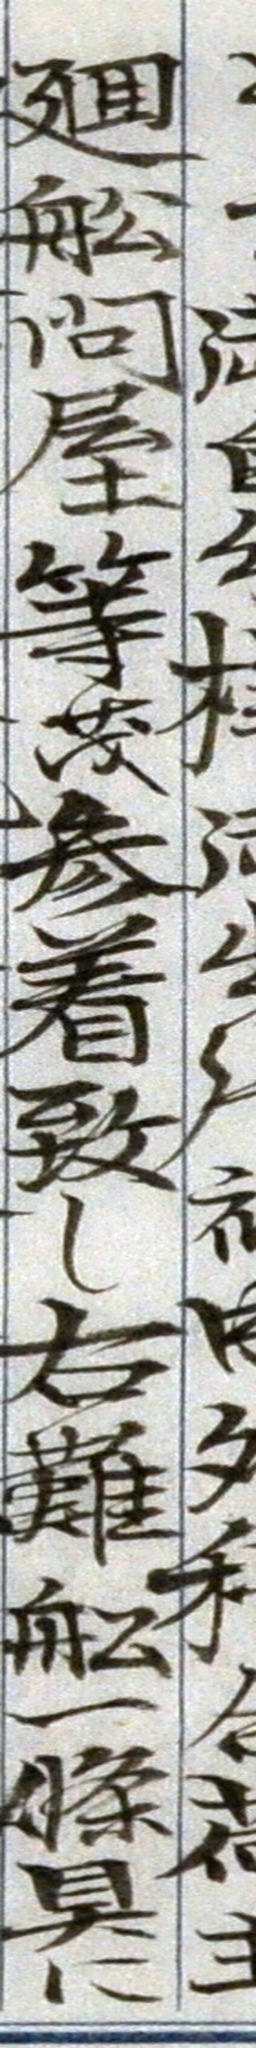廻船問屋等も参着致し右一條具に
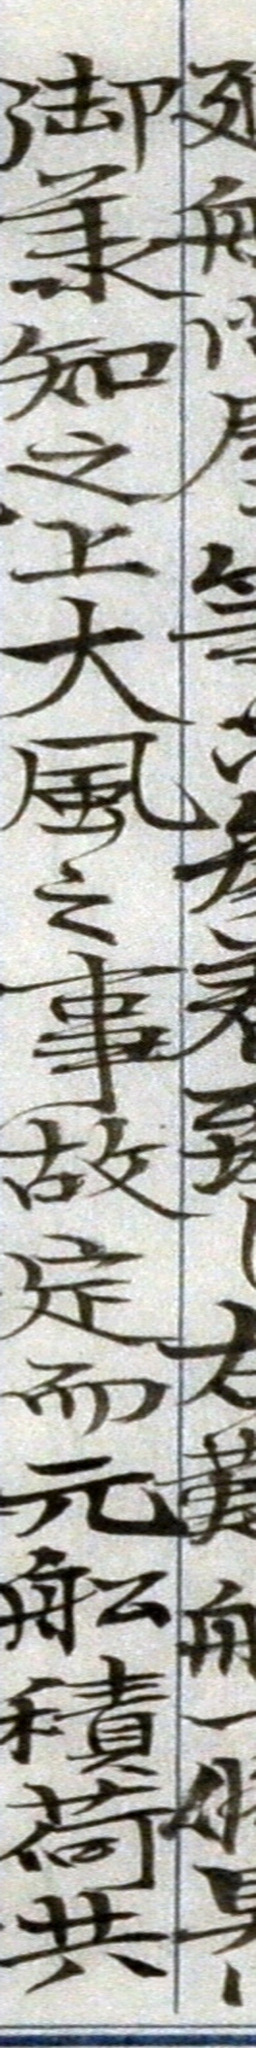御承知之上大風之事故定而元船積荷共
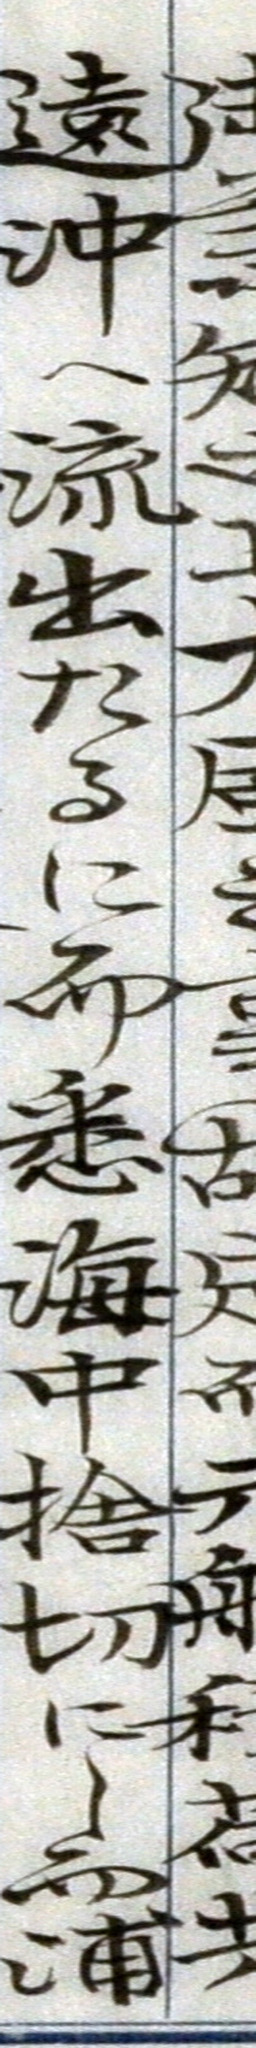遠沖へ流出たるに而悉海中捨切にし而浦
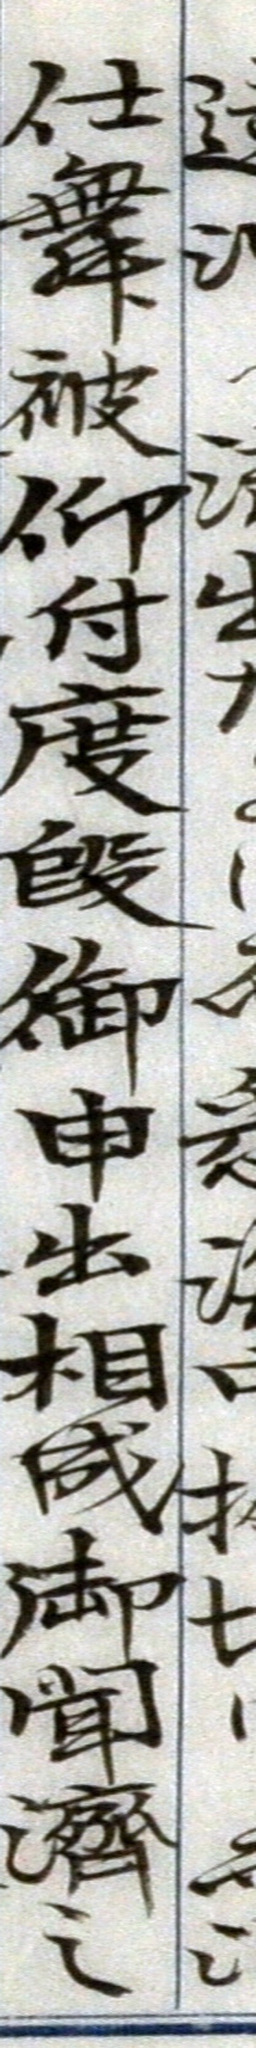仕舞被仰付度段御申出相成り御聞済之
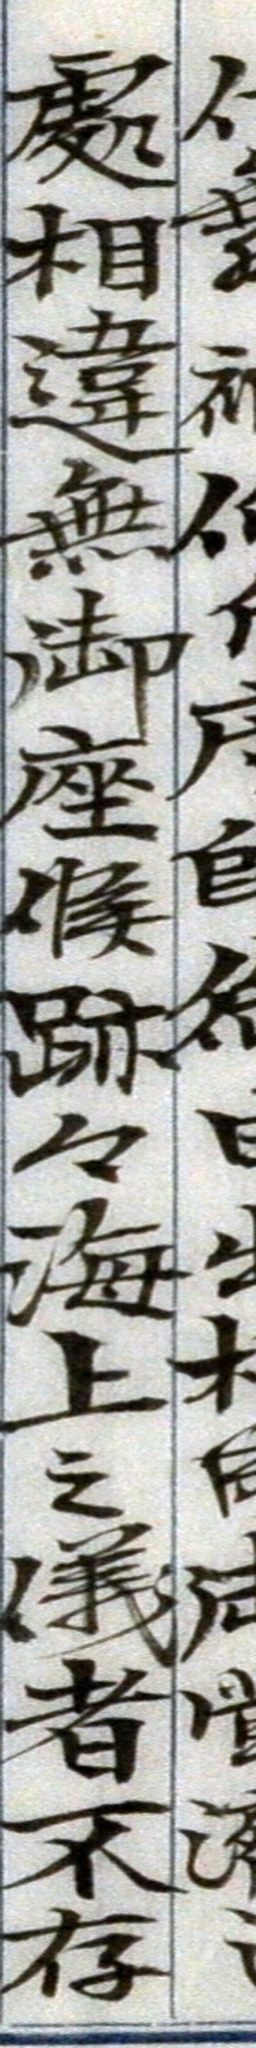處相違無御座候跡々海上之儀者不存
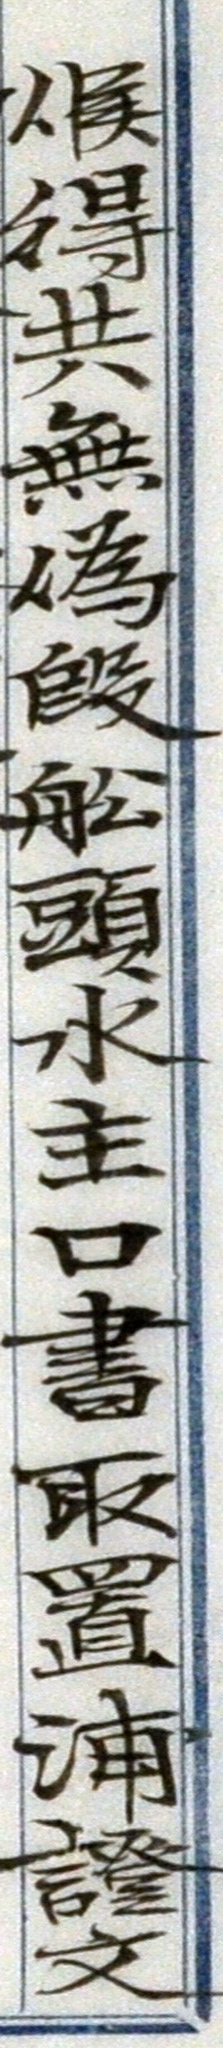候得共無偽段船頭水主口書取置浦証文
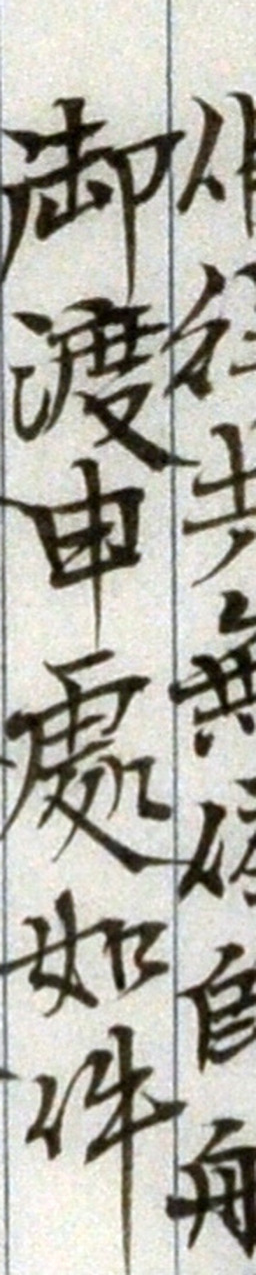御渡申處如件
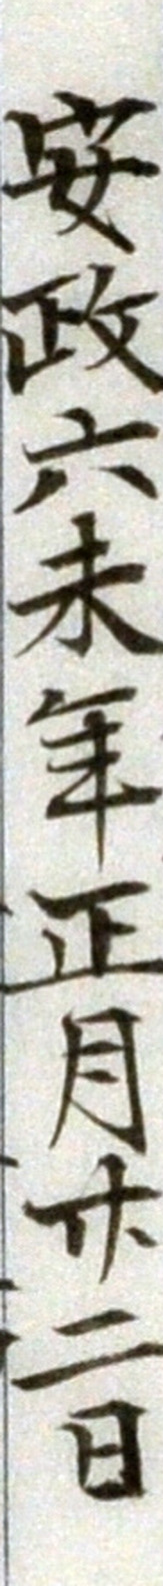安政六未年正月廿二日
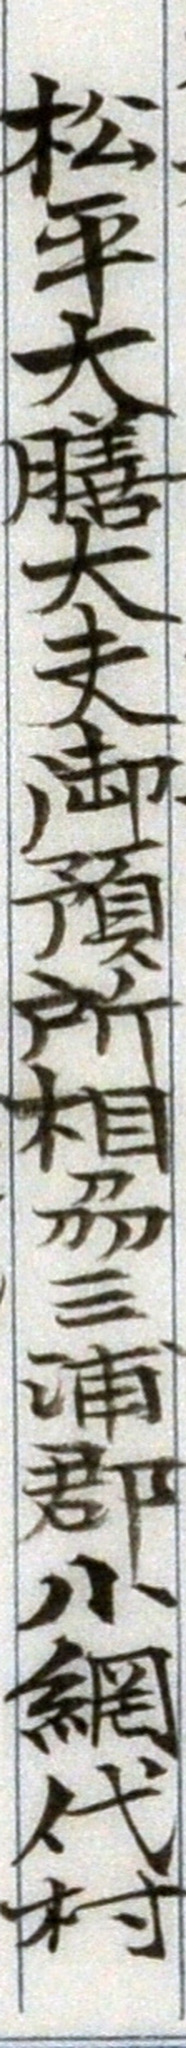松平大膳大夫御預所相州三浦郡小網代村
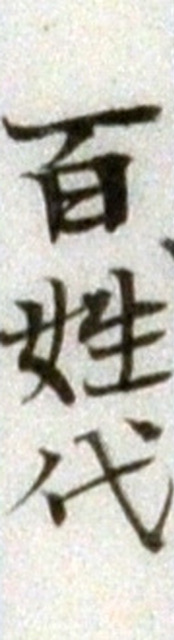百姓代
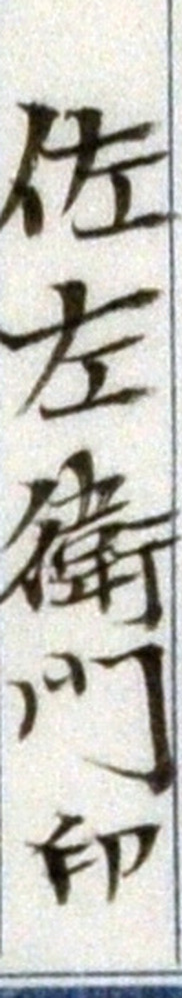佐左衛門印
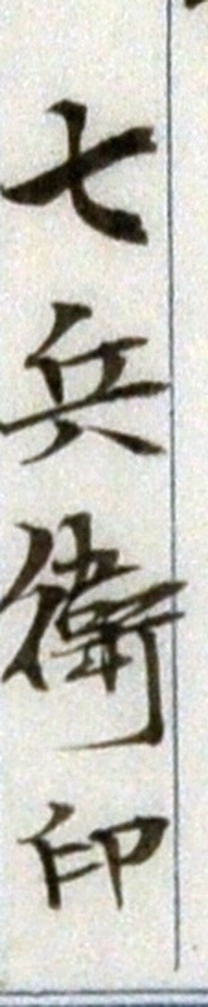七兵衛印
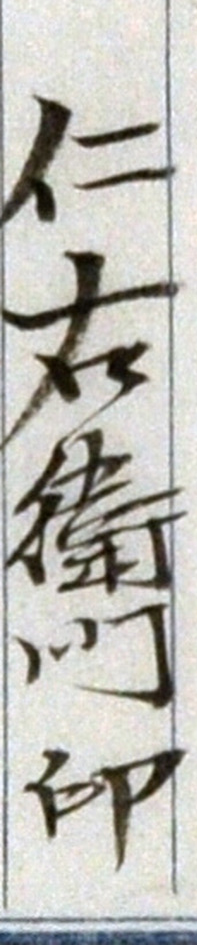仁右衛門印
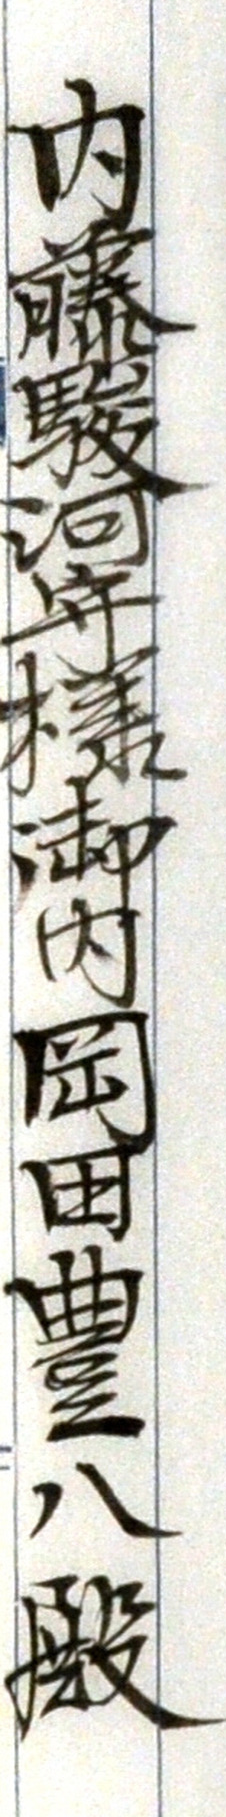内藤駿河守様御内岡田豊八殿

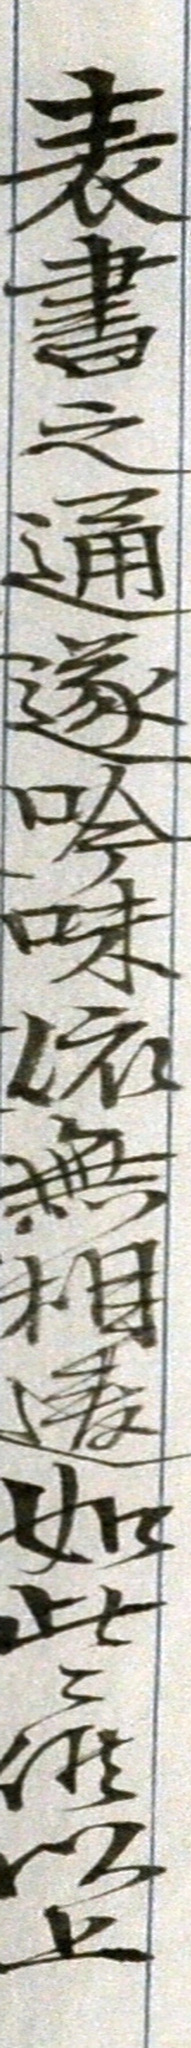表書之通遂吟味依無相違如此に候以上
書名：御廻米難船始末
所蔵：伊那市立高遠町図書館・合同会社AMANE
